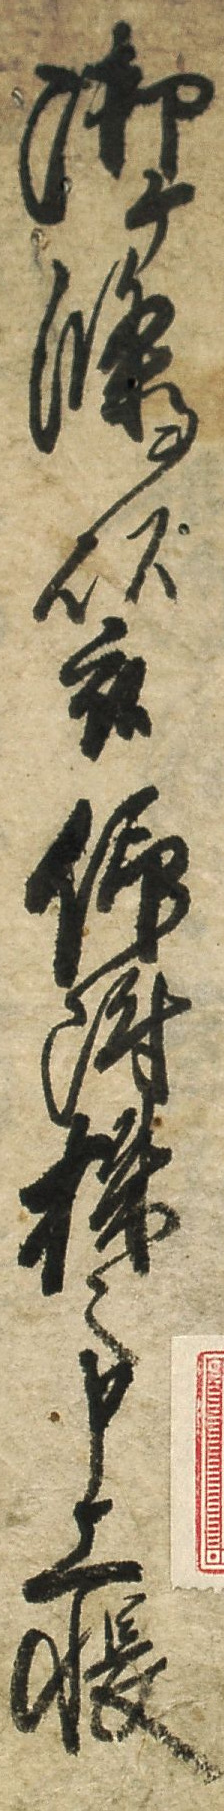御ヶ條ヲ以被仰附株之申上帳
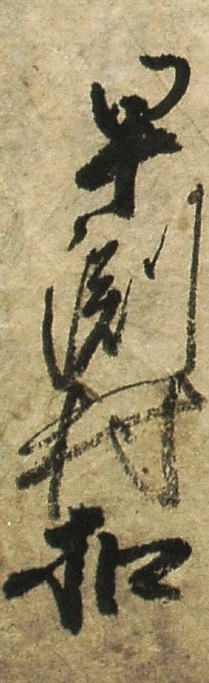早渕村扣

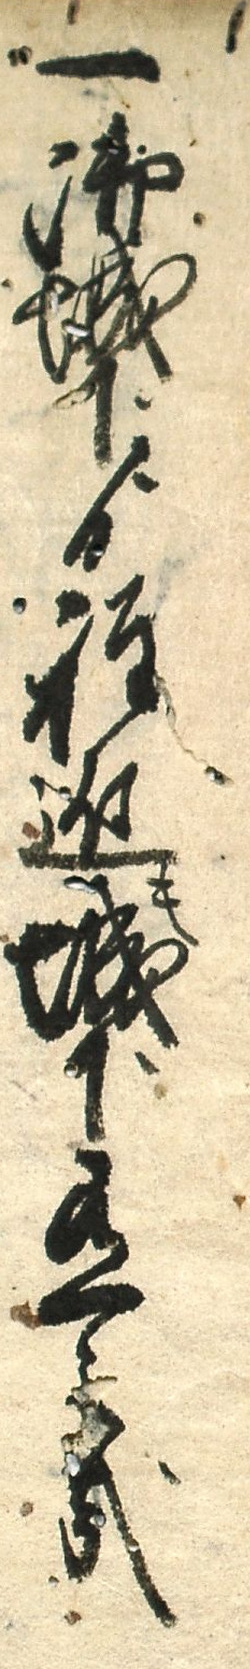一御城下ゟ程近キ城下有之哉
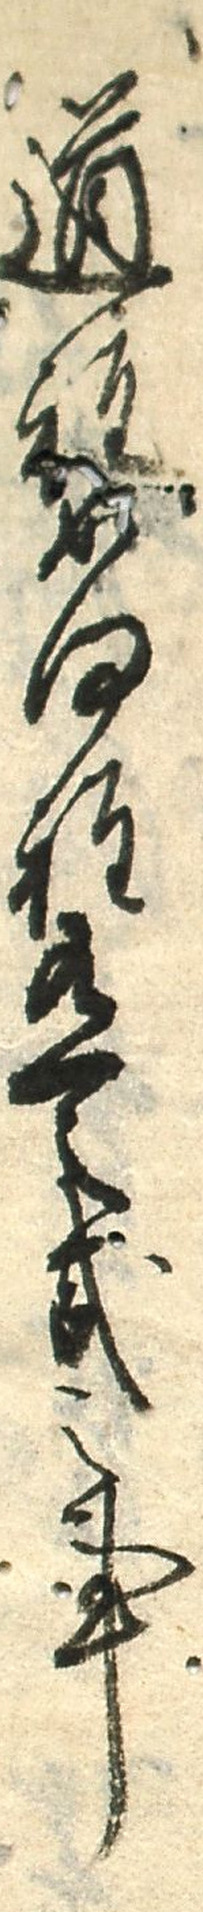道程如何程有之哉之事
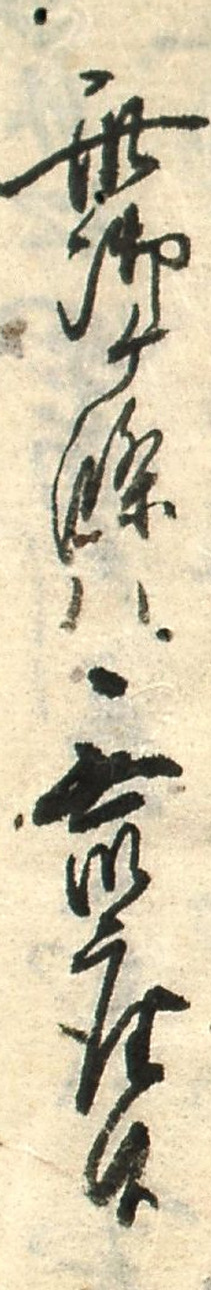此御ヶ條ハ無御座候
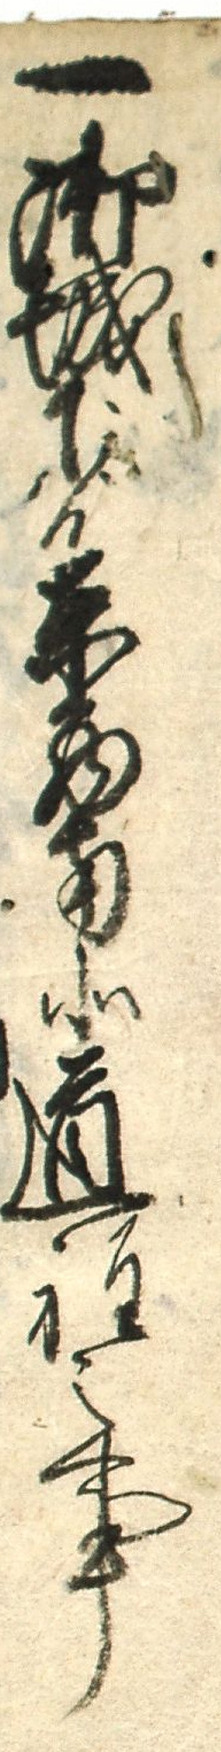一御城下ゟ東西南北道程之事
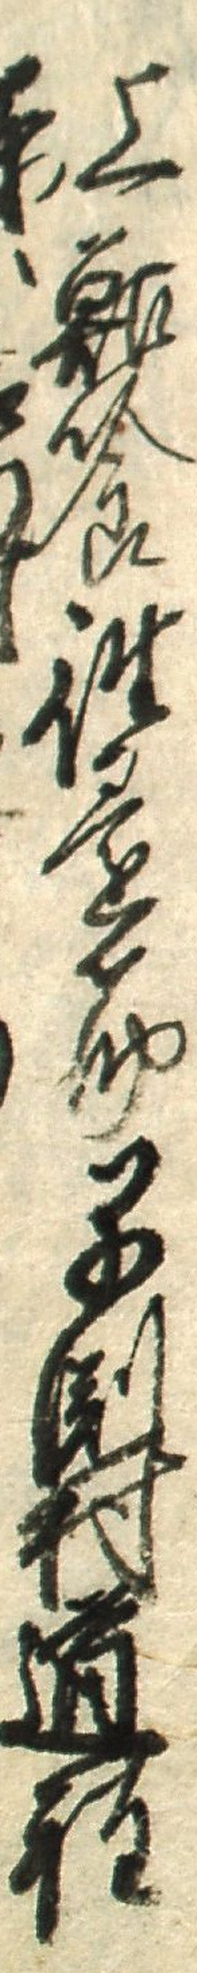上鮎喰往還筋早渕村道程
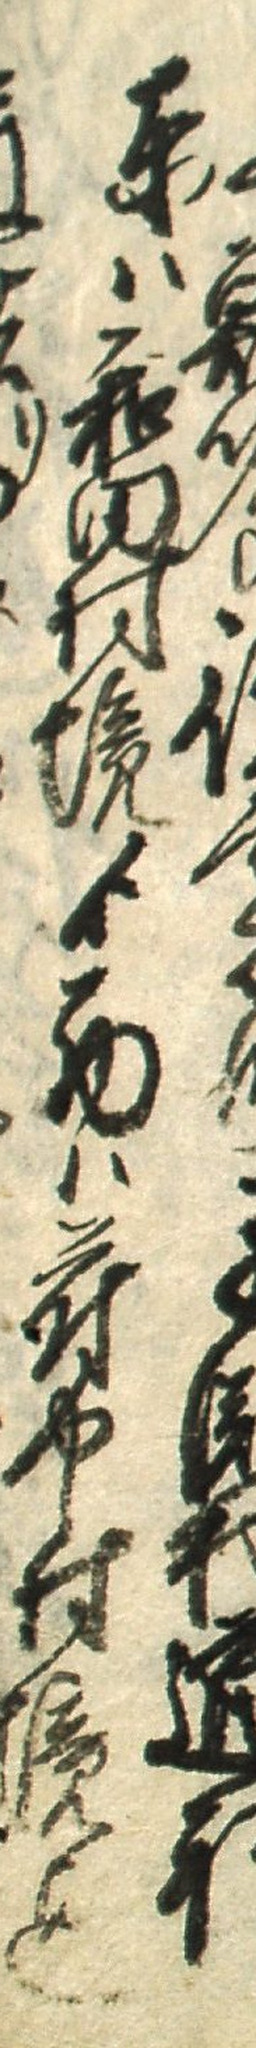東ハ和田村境ゟ西ハ府中村境迄
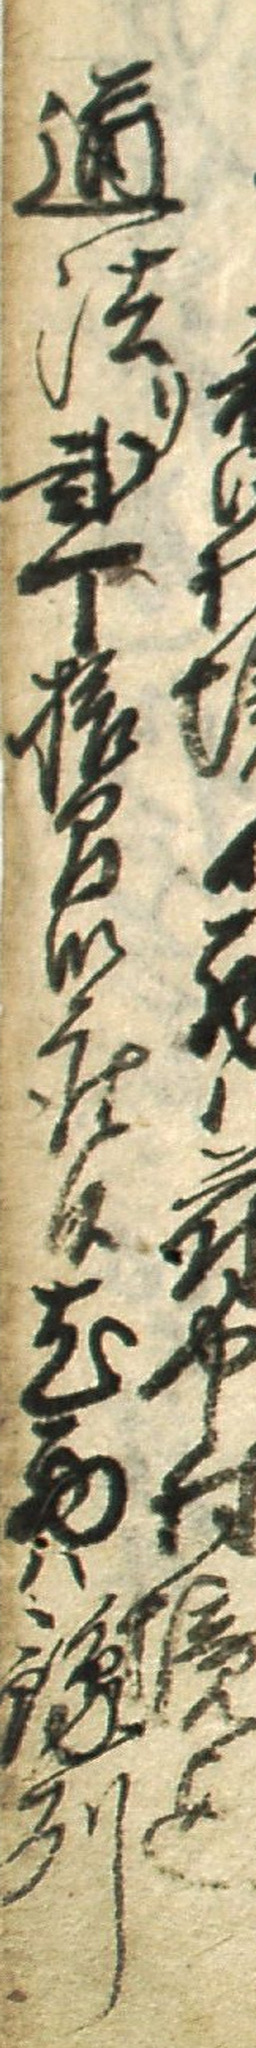道法り弐丁拾間御座候尤西ハ豫州

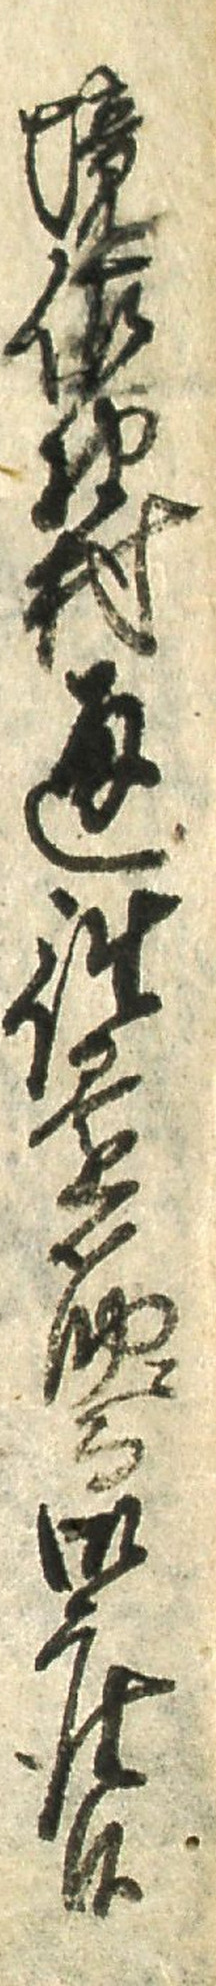境佐野村通往還ニ而御座候
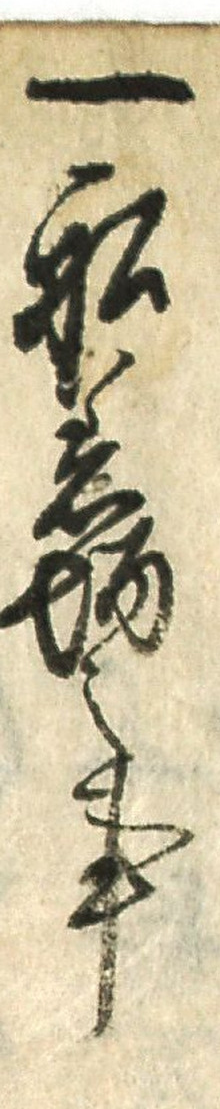一船着場之事
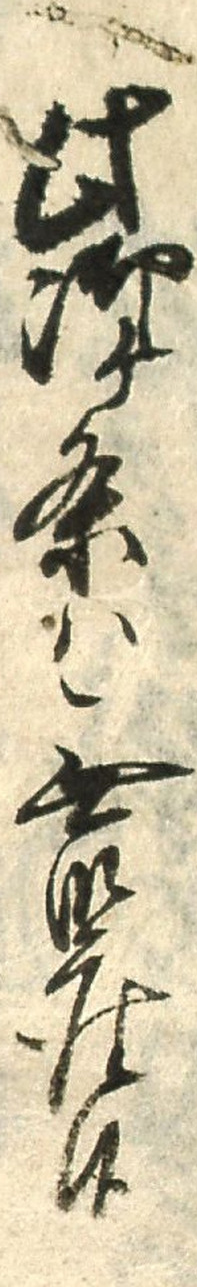此御ヶ条ハ無御座候
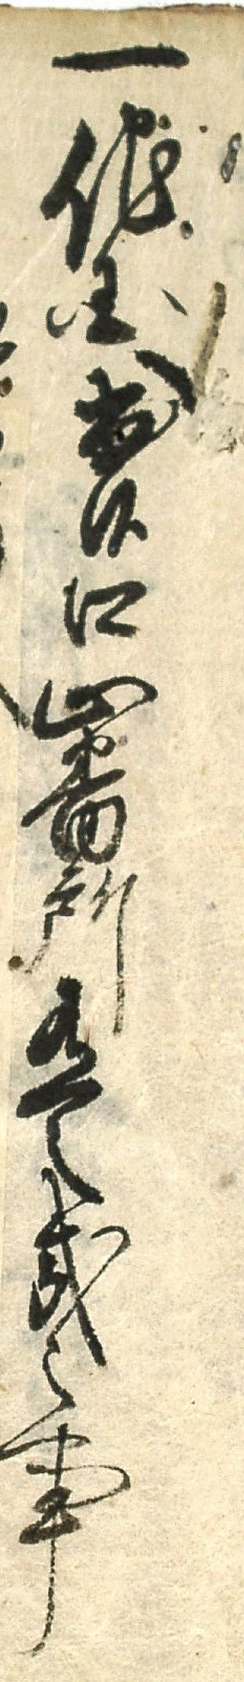一他国へ出候口止番所有之哉之事
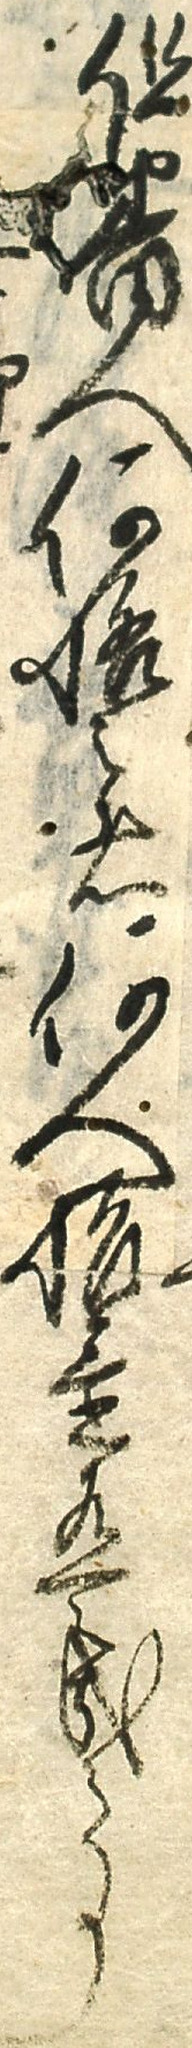但番人何格之者何人指置有之哉之事
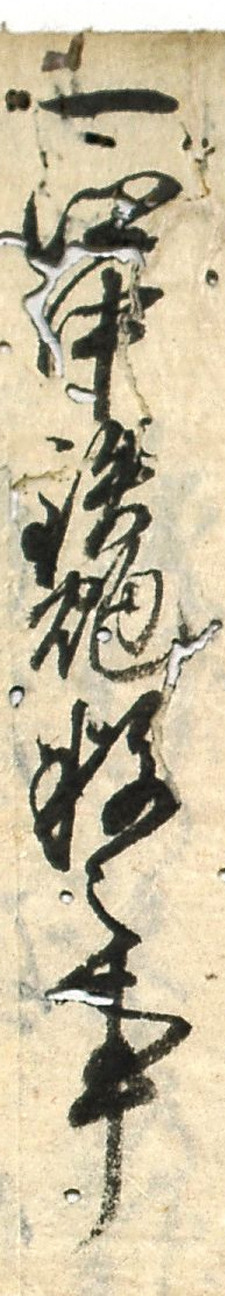一郷中鉄炮数之事
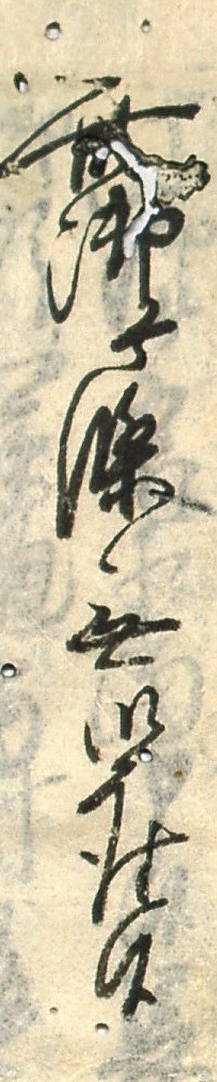此御ヶ條無御座候
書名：御ヶ条ヲ以被仰附株々申上帳（早渕村控）
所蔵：鳴門教育大学 Naruto University of Education
